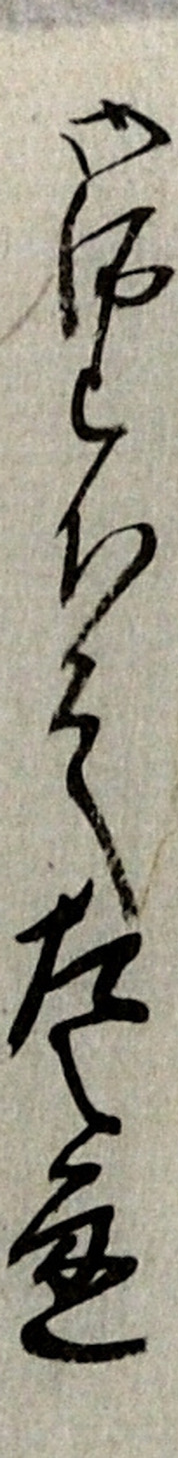御酒被下左之通
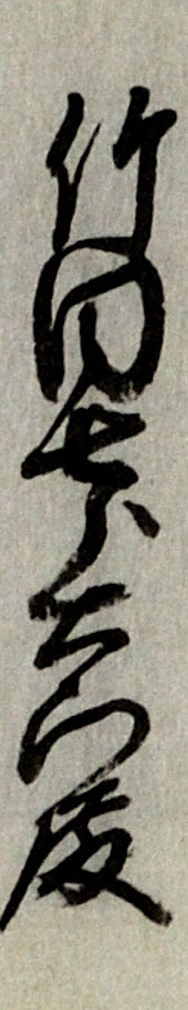竹田七郎右衛門殿
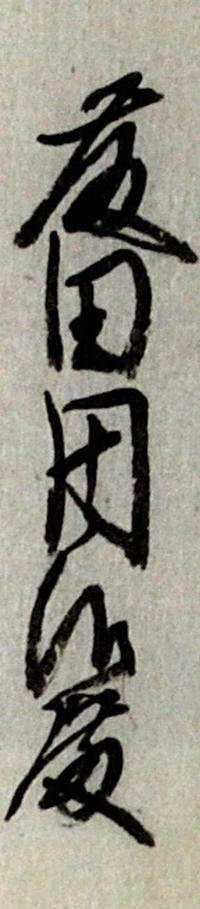藤田周治殿

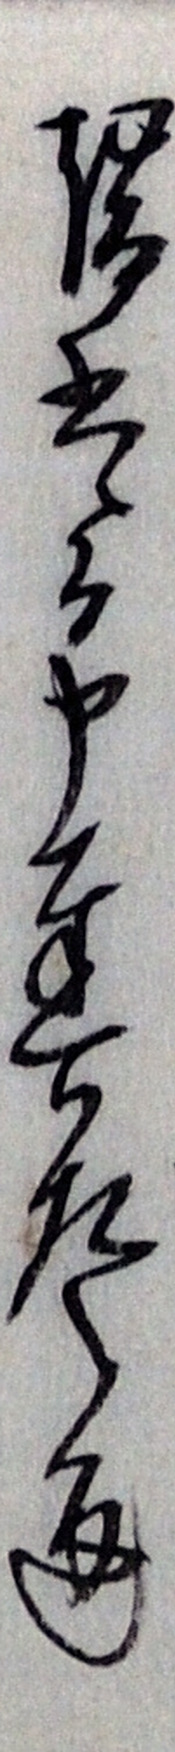端書ニ而申達候左之通
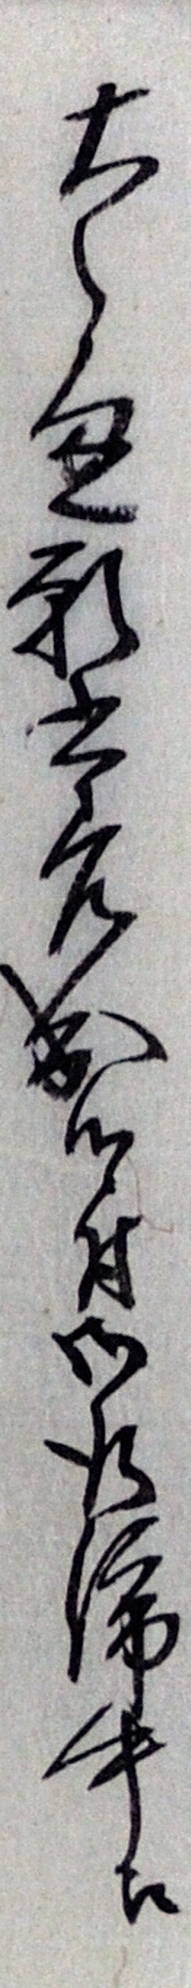右之通願書差出候ニ付御取締中江
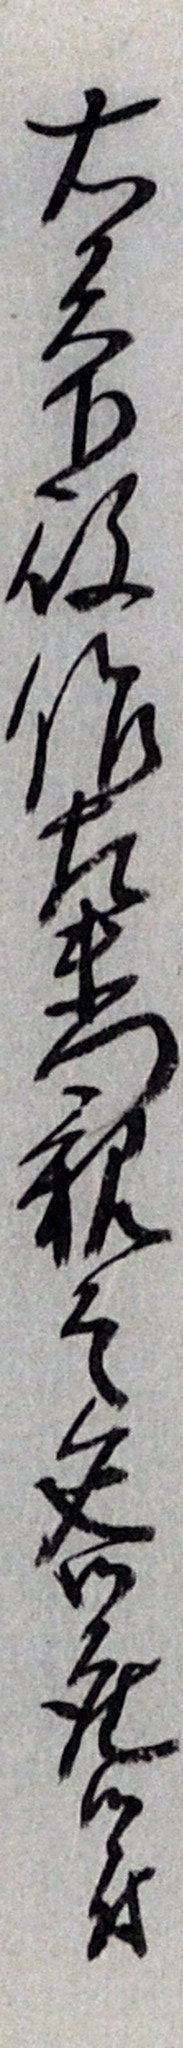右者下役作左衛門親之名御座候付
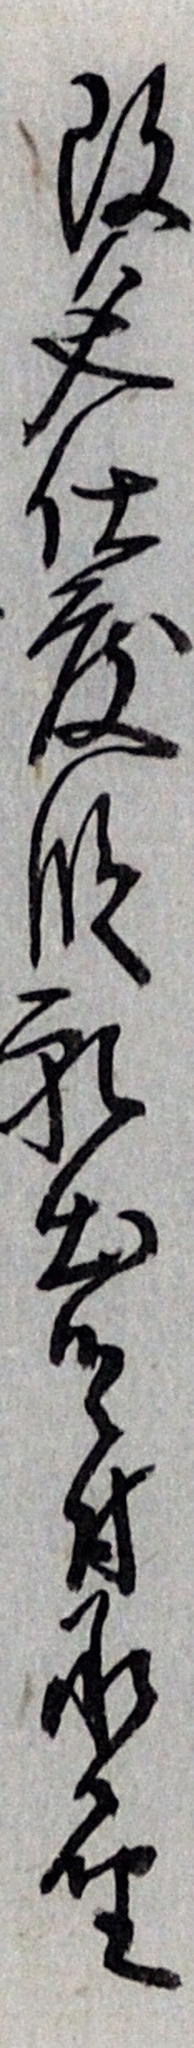改名仕度段願書候ニ付承届
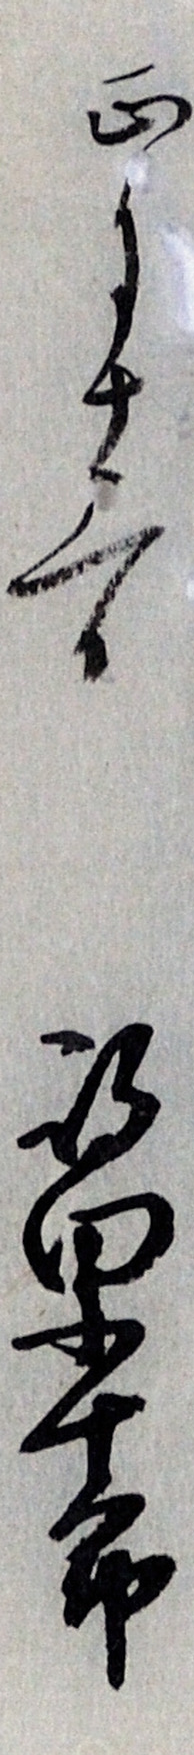正月十三日嶋田小十郎
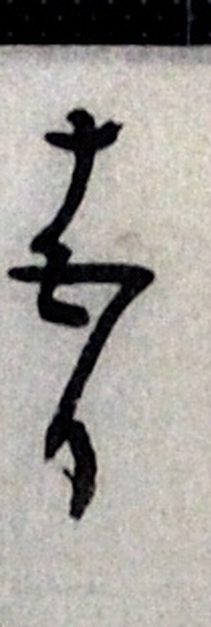十五日
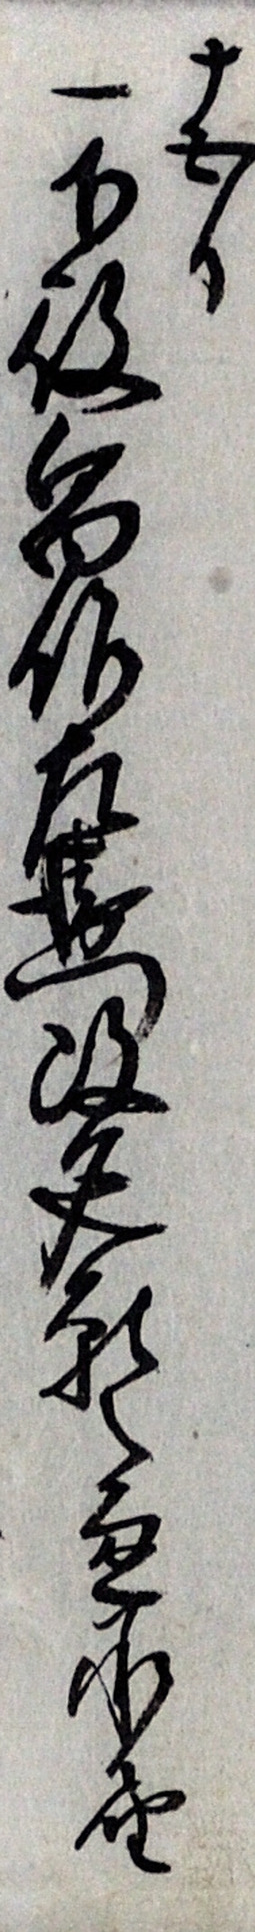一下役畠作左衛門改名願之通承届
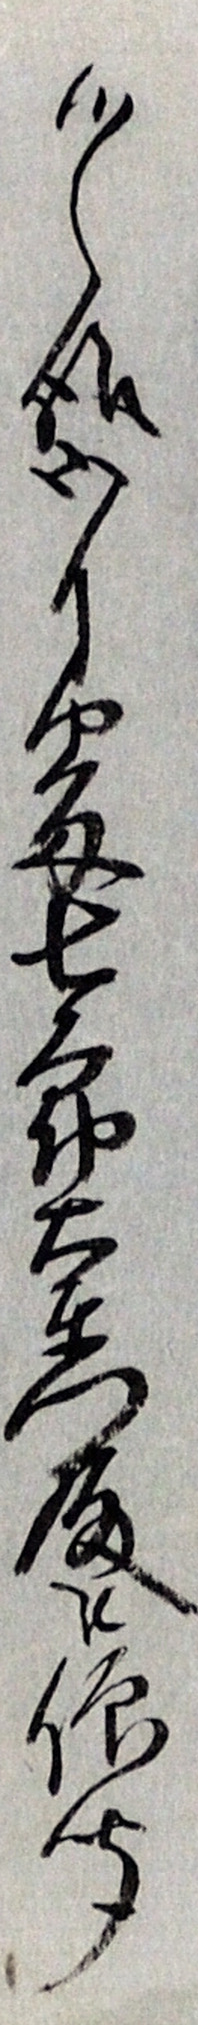候之様御月番七郎右衛門殿被仰聞
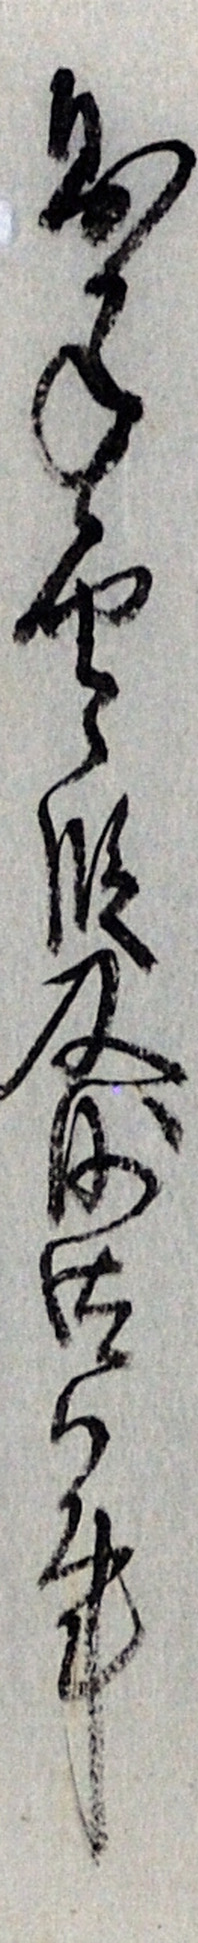則承届候段及沙汰候事
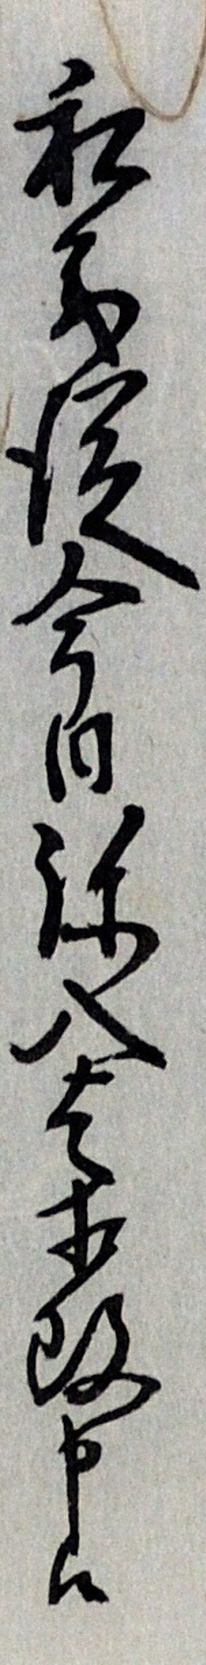私義従今日弥八与相改申候
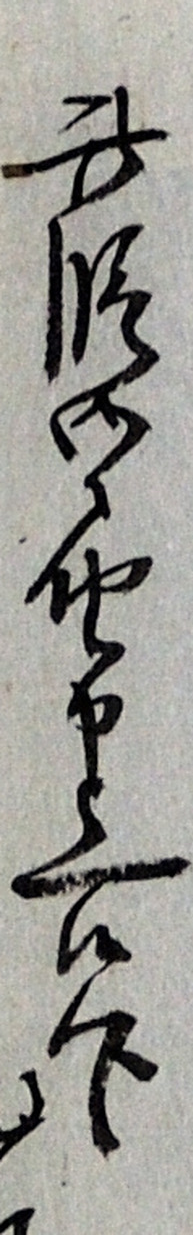此段御届申上候以上
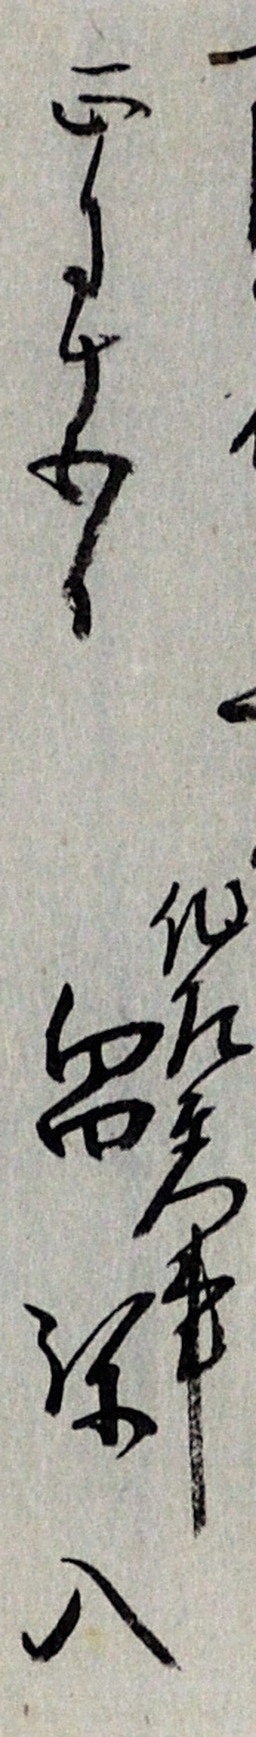正月十五日嶋田小十郎
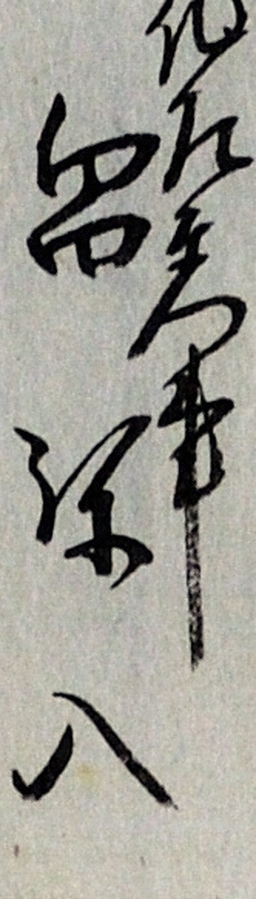畠弥八
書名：諸事御用留
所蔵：伊那市立高遠町図書館・合同会社AMANE
